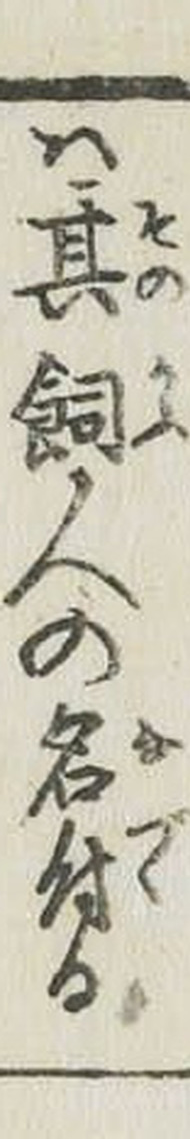は其飼人の名付る
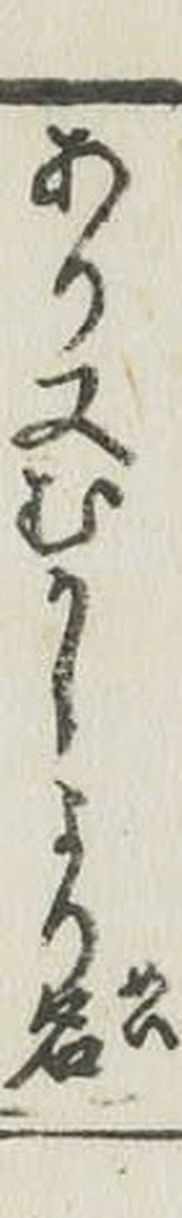あり又むかしより名
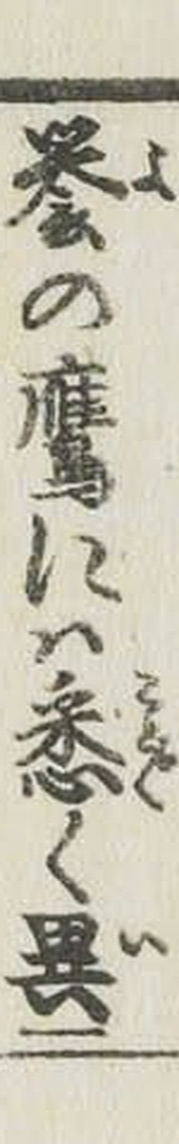誉の鷹には悉く異
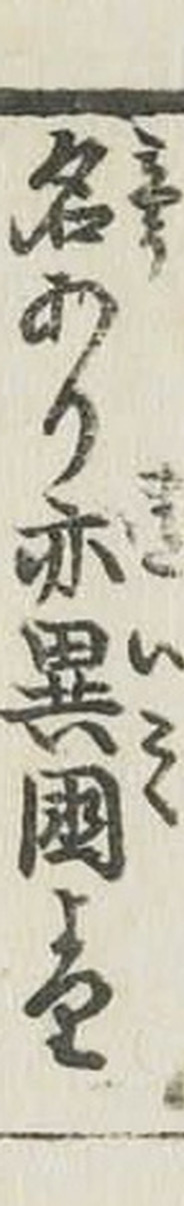名あり亦異国より
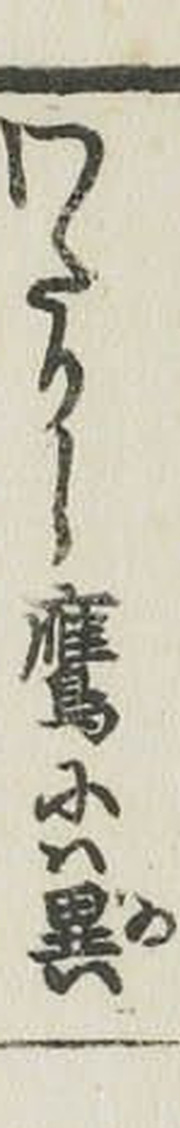わたりし鷹には異
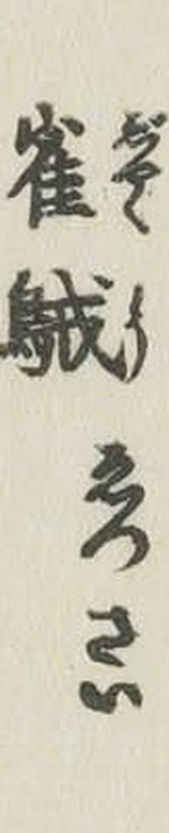雀𪀚ゑつさい
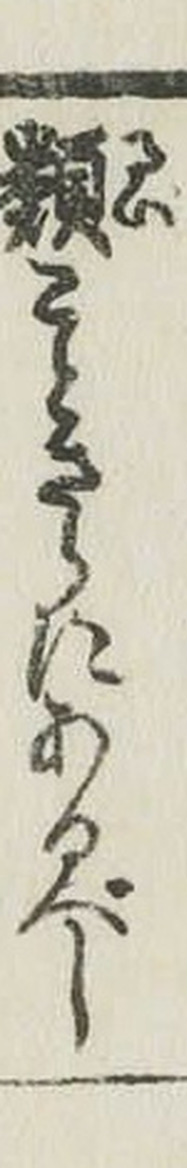類ことさらにあるべし
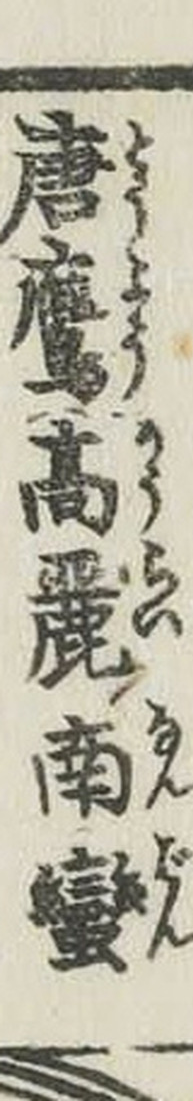唐鷹高麗南蛮
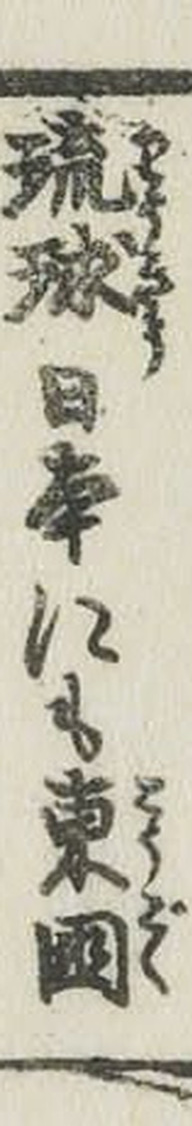琉球日本にも東国
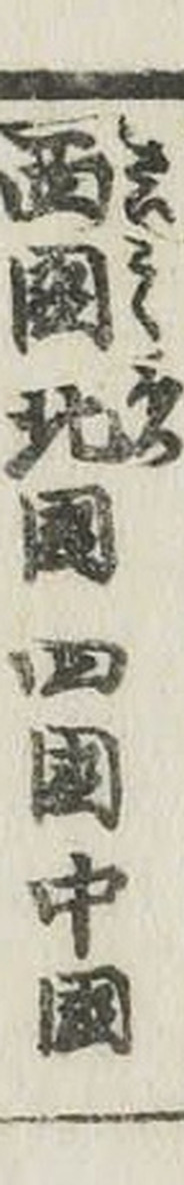西国北国四国中国
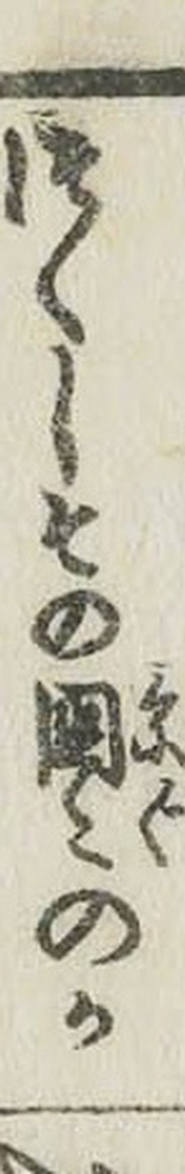つくしその国々のか
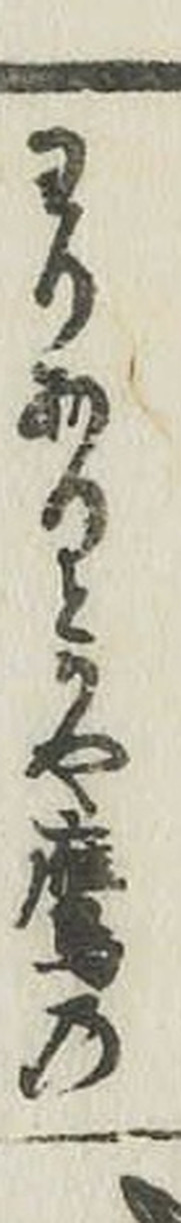わりありとかや鷹の
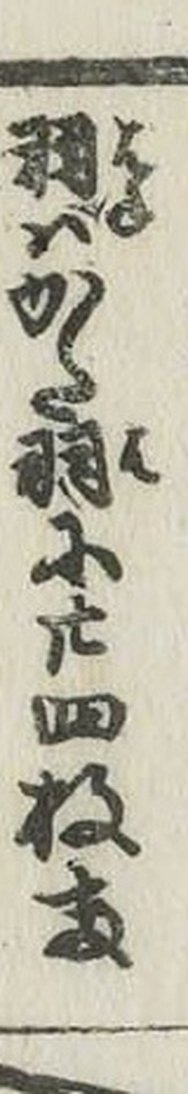羽はかた羽に廿四枚両
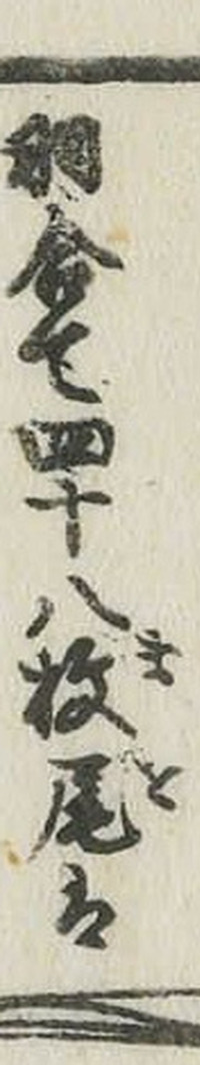羽合て四十八枚尾は
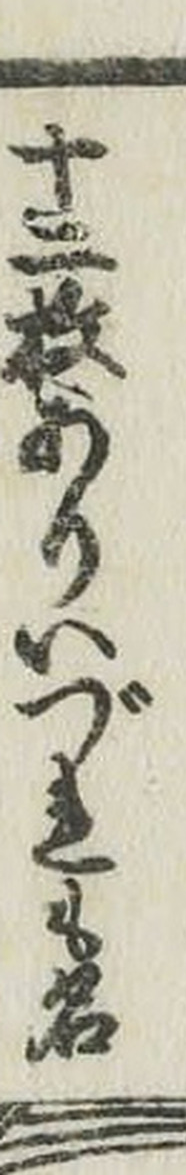十二枚ありいづれも名
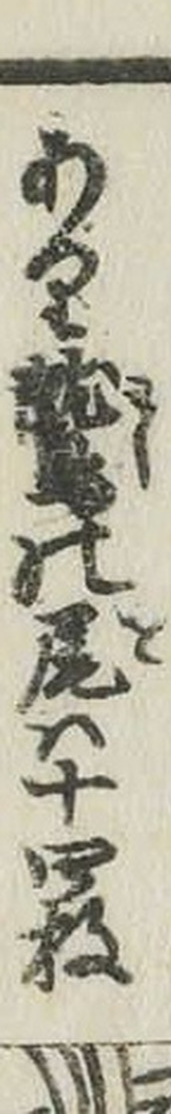あり鷲の尾は十四枚
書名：増補頭書訓蒙図彙大成 10巻 6:巻之12-13
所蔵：東京学芸大学教育コンテンツアーカイブ
